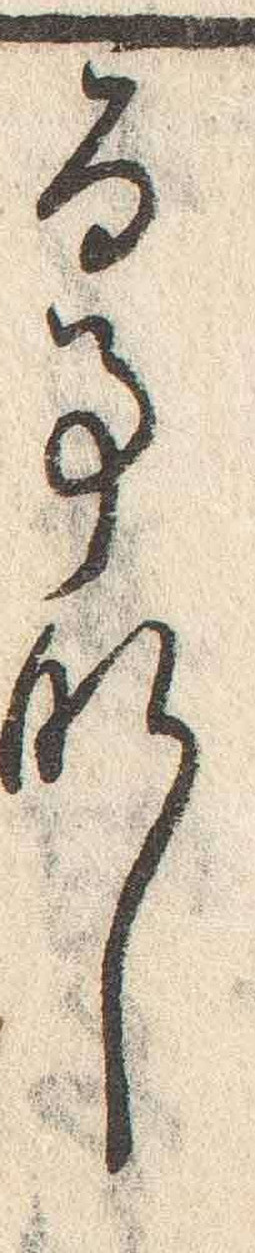る事なし
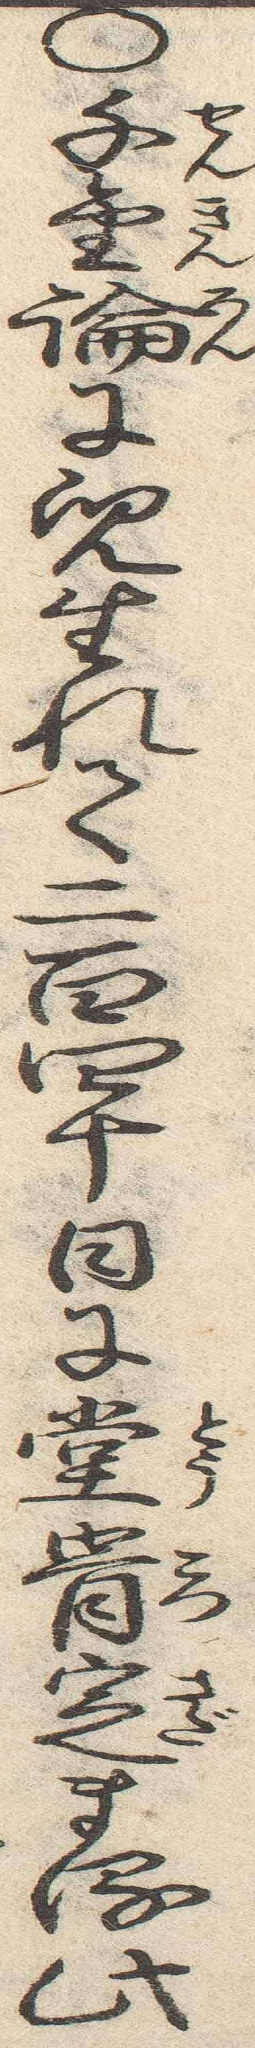○千金論に児生れて二百四十日に堂骨定まる此
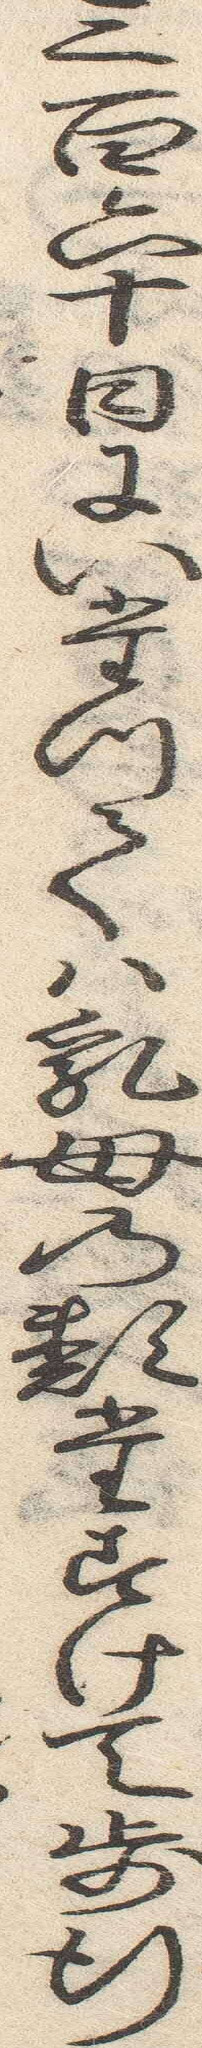三百六十日にいたつては乳母の類たすけて歩行
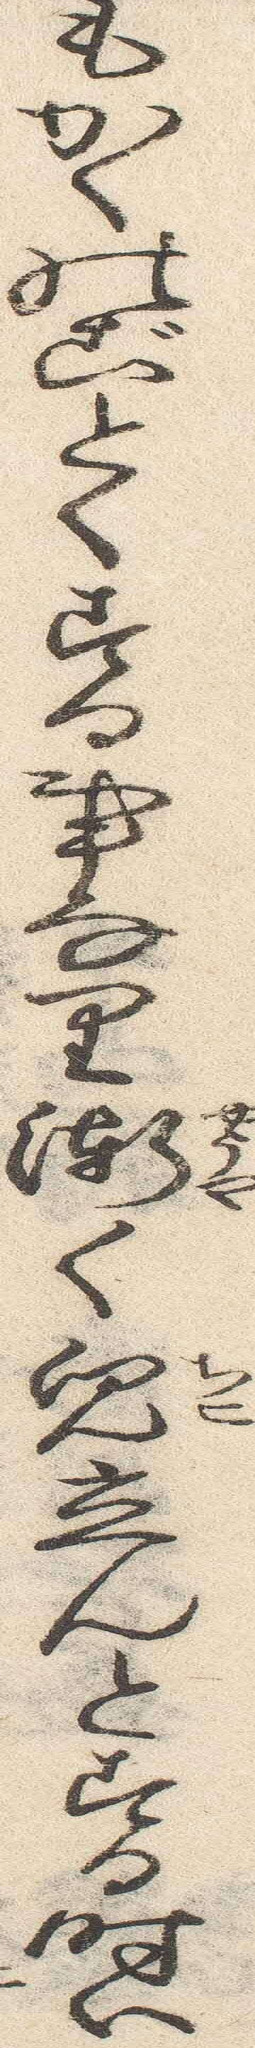もかくのごとくする事なり漸く児立んとする時は
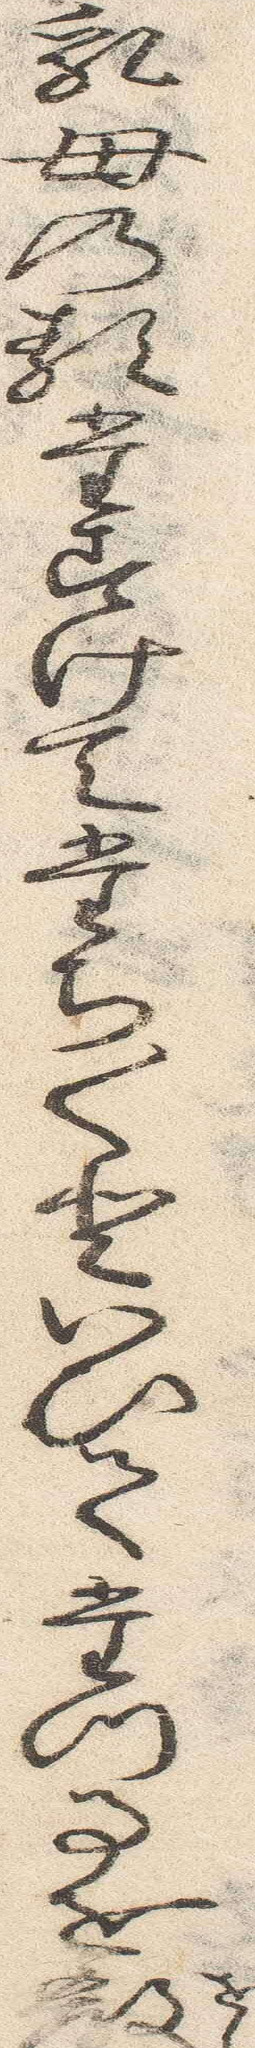乳母の類たすけてたち〳〵といひてたつ事を教
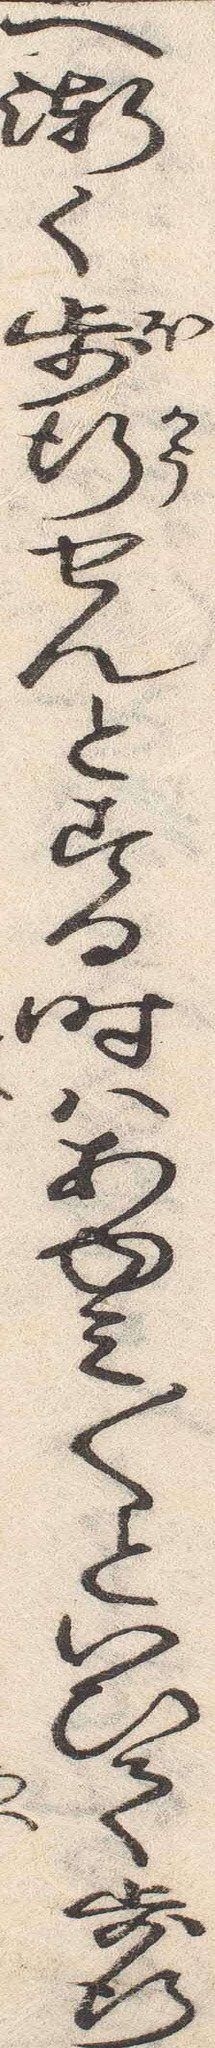へ漸く歩行せんとする時はあゆみ〳〵といひて歩行
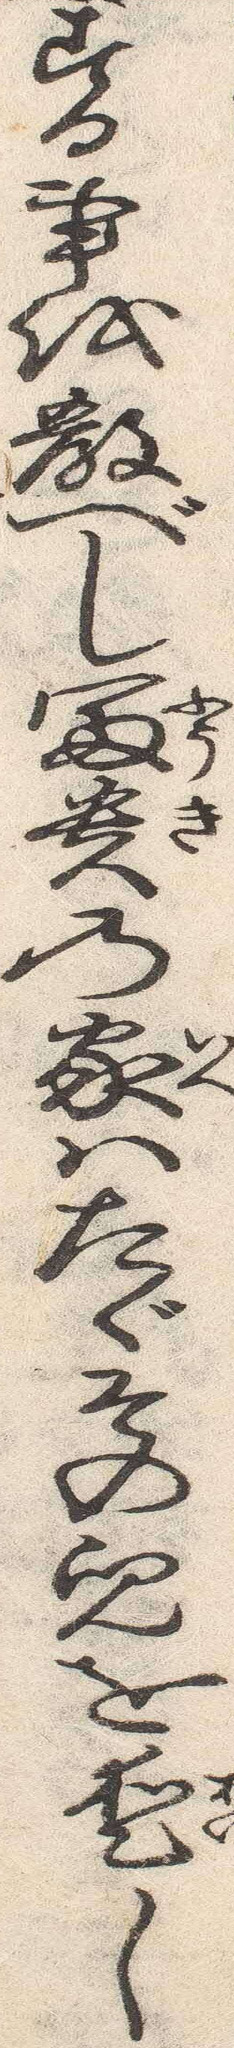する事を教べし富貴の家はたゞその児を愛し
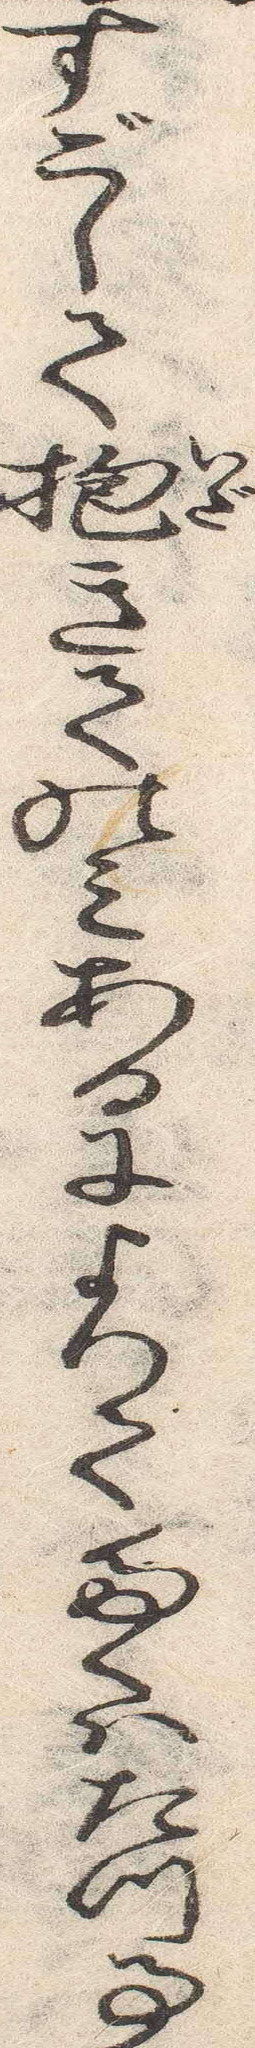すごして抱きてのみあるによりて多くはたつ事
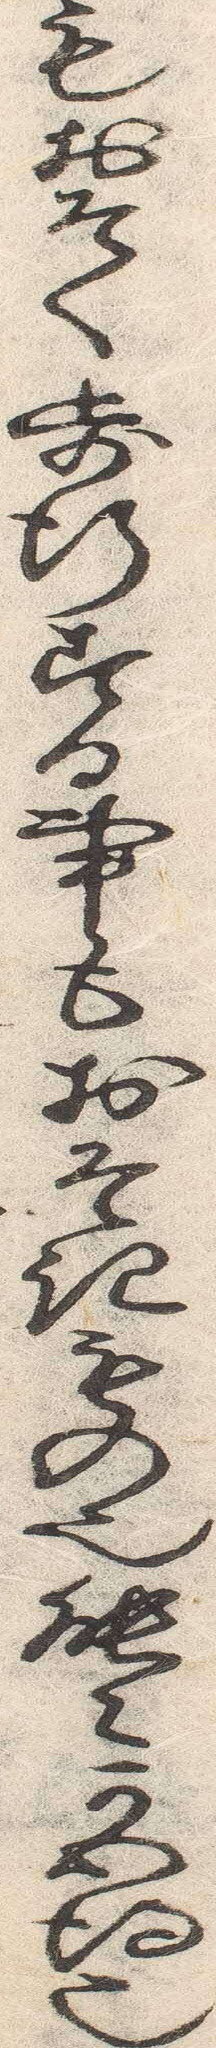もおそく歩行する事もおそきもの也能々可心得也
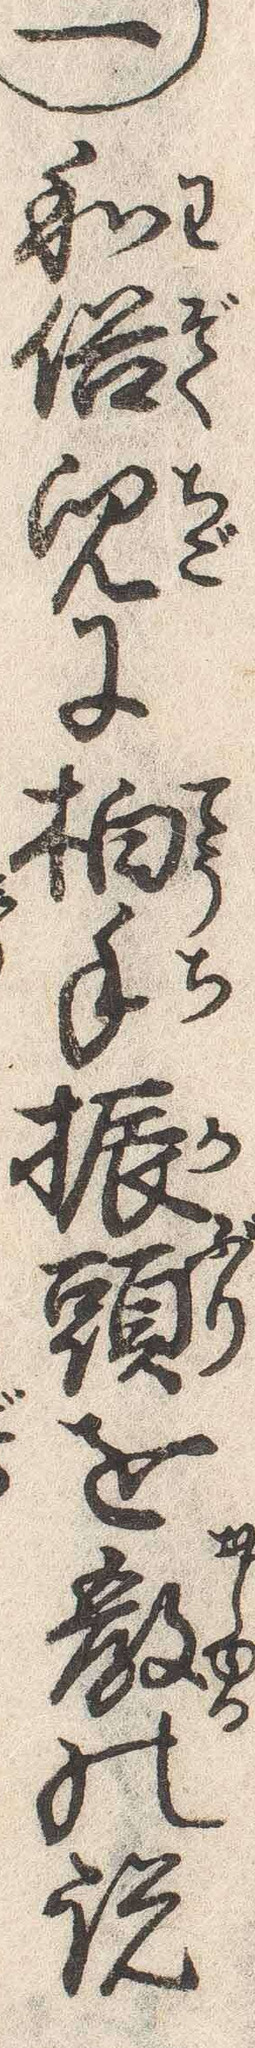㊁和俗児に拍手振頭を教るの説
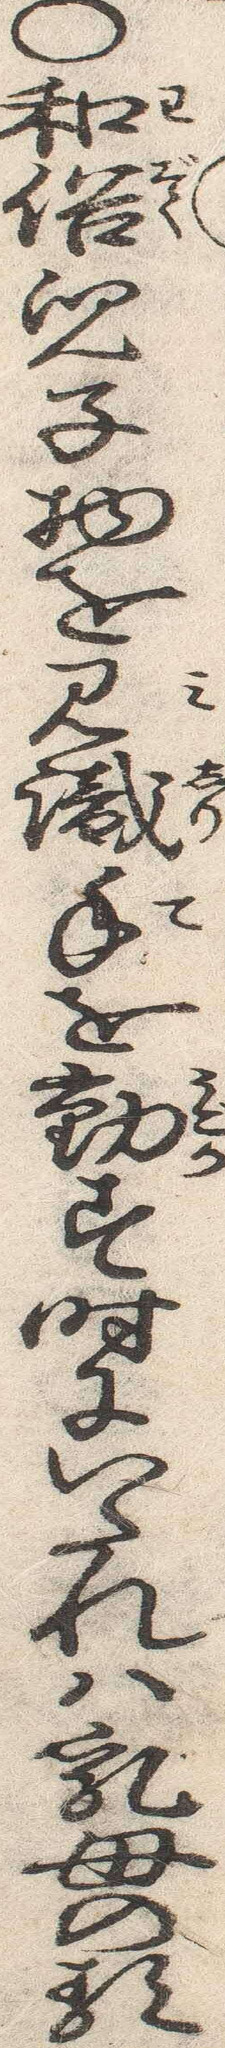○和俗児子物を見識手を動す時にいたれは乳母の類
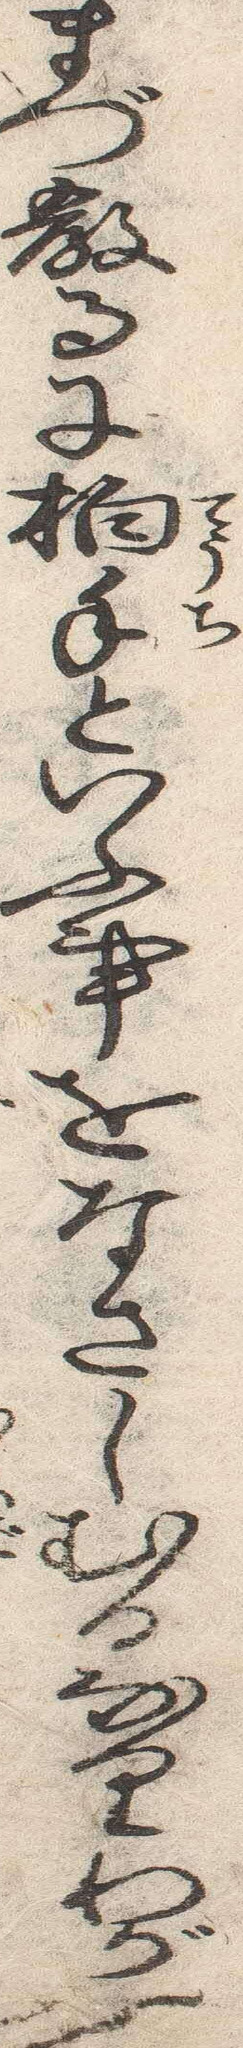まづ教るに拍手といふ事をなさしむるなりわが
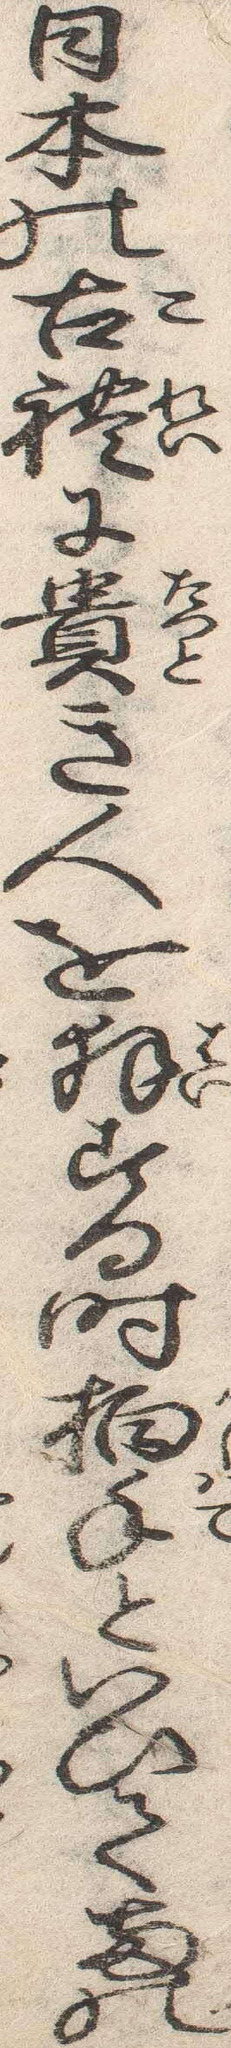日本の古礼に貴き人を拝する時拍手といひて両の
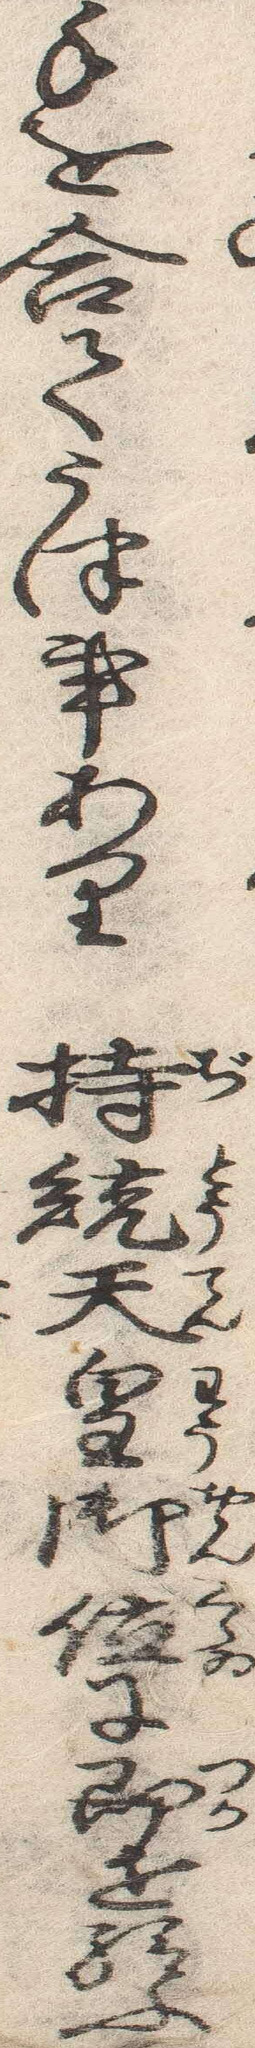手を合てうつ事あり持統天皇御位に即せ給ふ
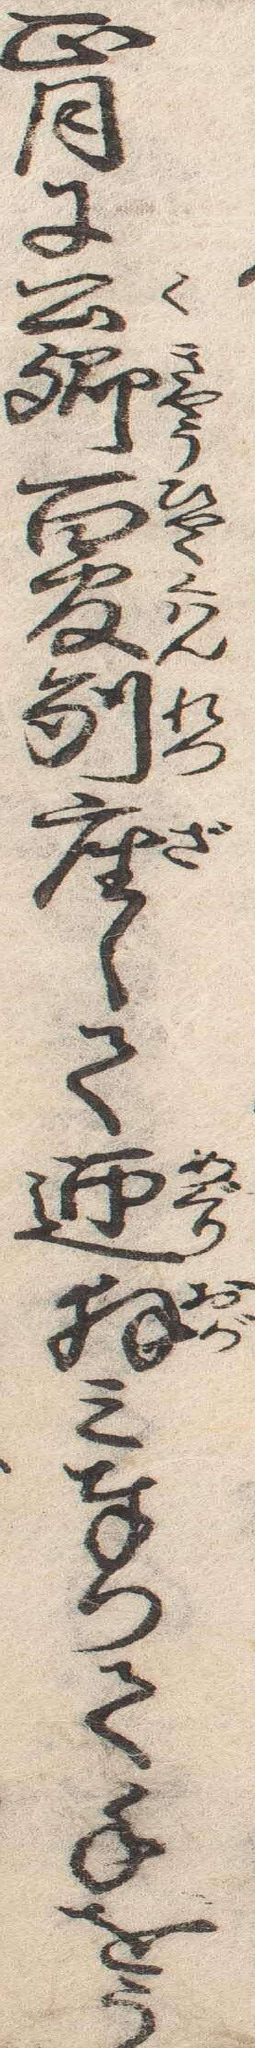正月に公卿百官列座して迊拝み奉りて手をう
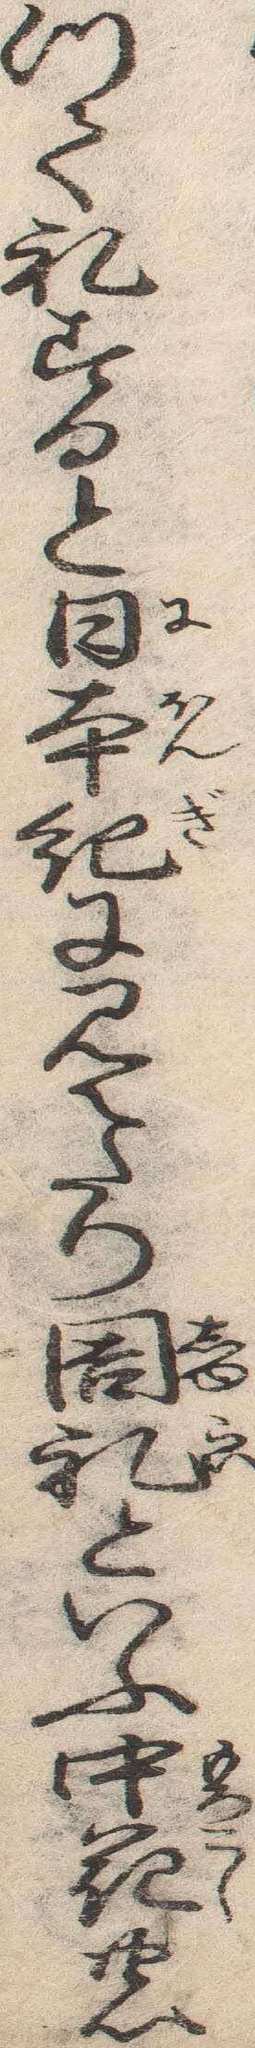つて礼すると日本紀に見えたり周礼といふ中花の
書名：小児必用養育草
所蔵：東京学芸大学附属図書館 国文学研究資料館
